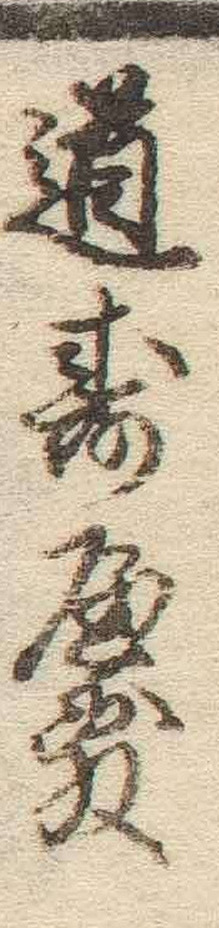道寿屋敷
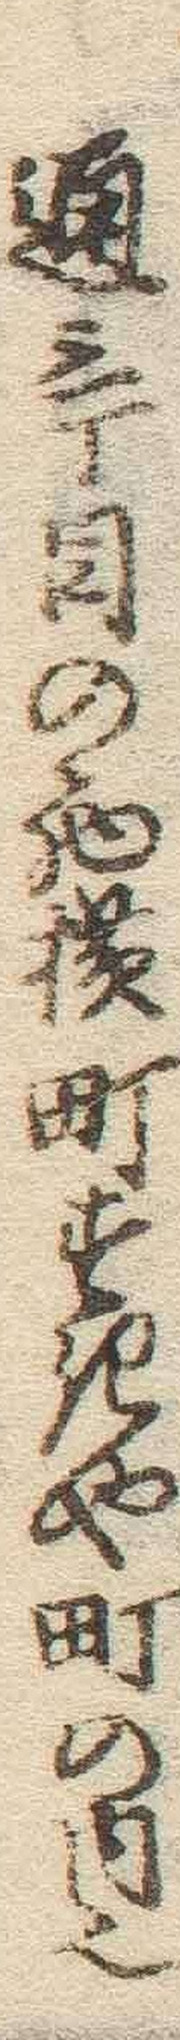通三丁目の西横町すきや町の内也
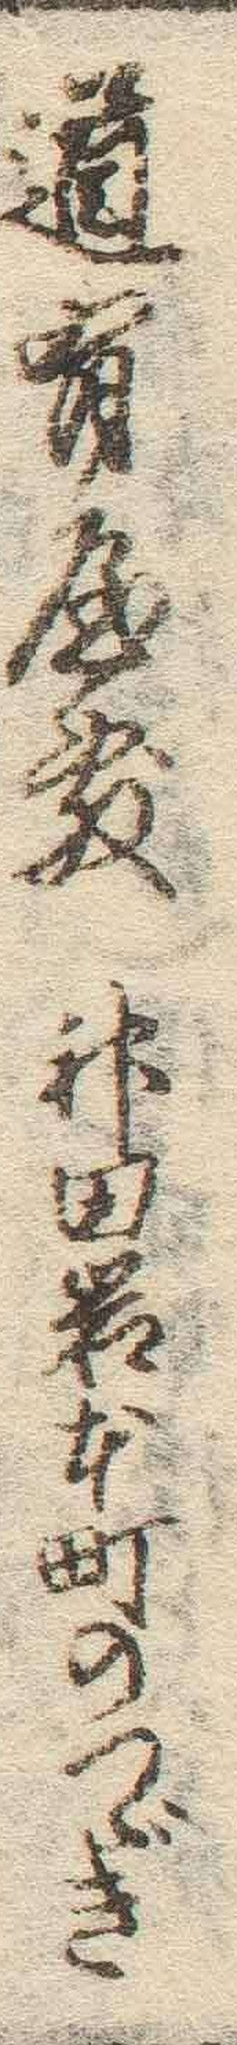道有屋敷神田岩本町のつゞき
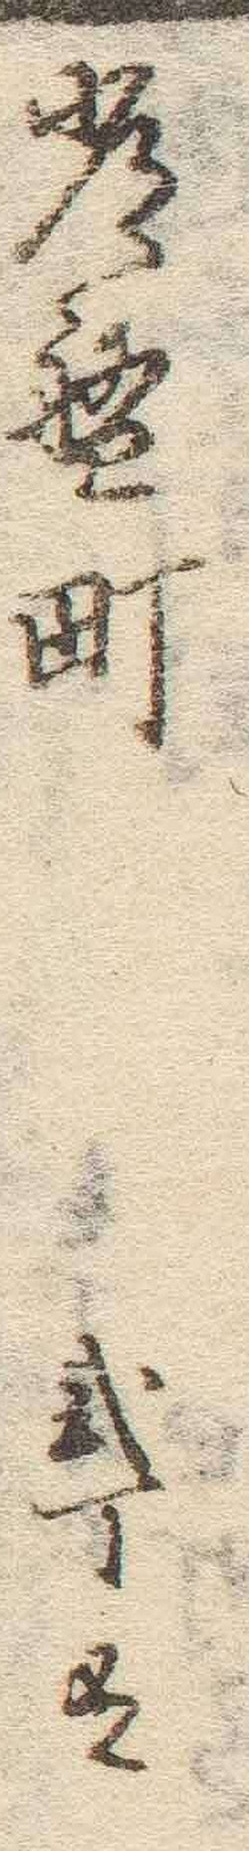常盤町弐丁有
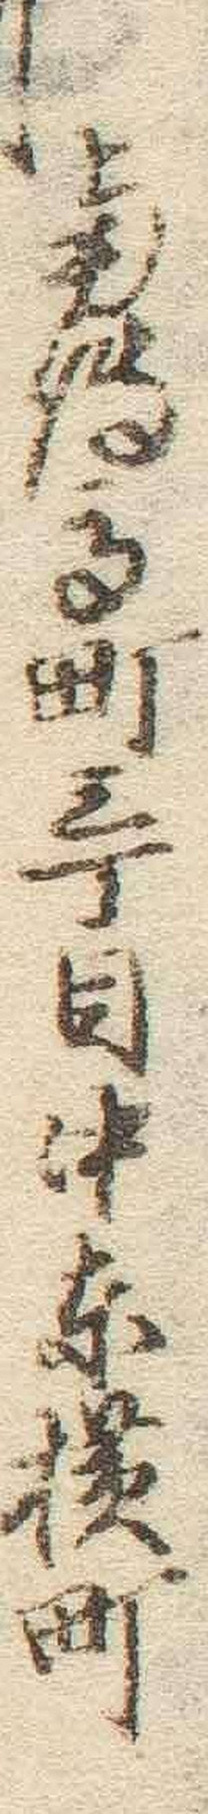南伝馬町三丁目中東横町
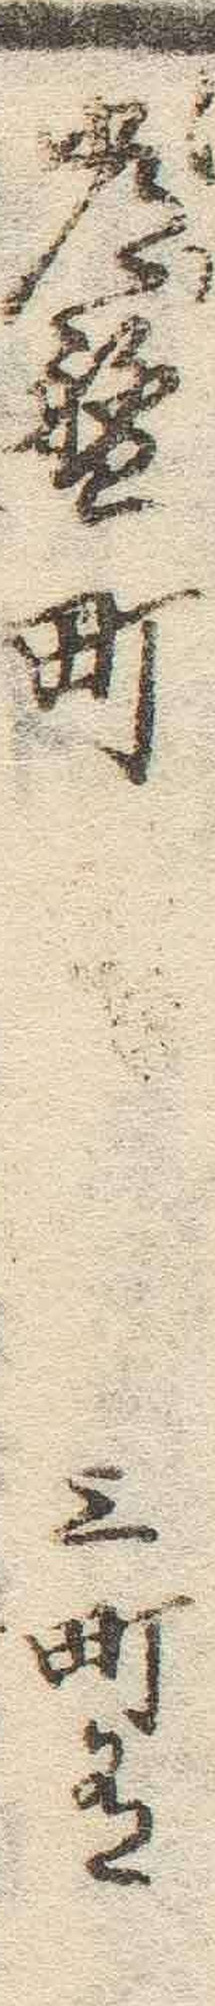常盤町三町有
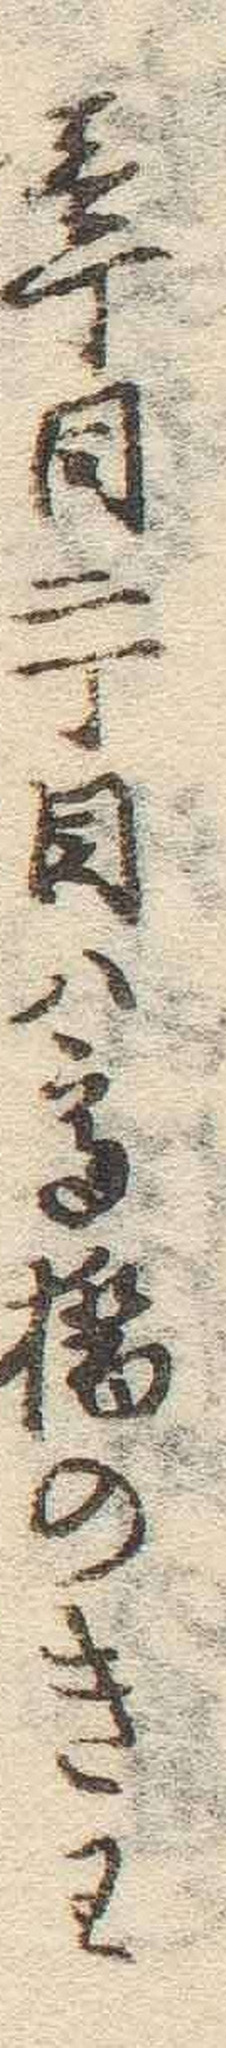壱丁目二丁目は高橋のきわ
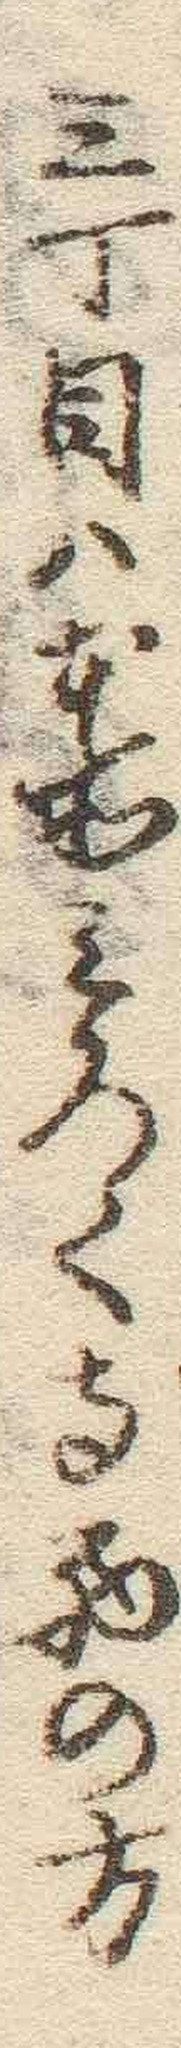三丁目は本所みろく寺西の方
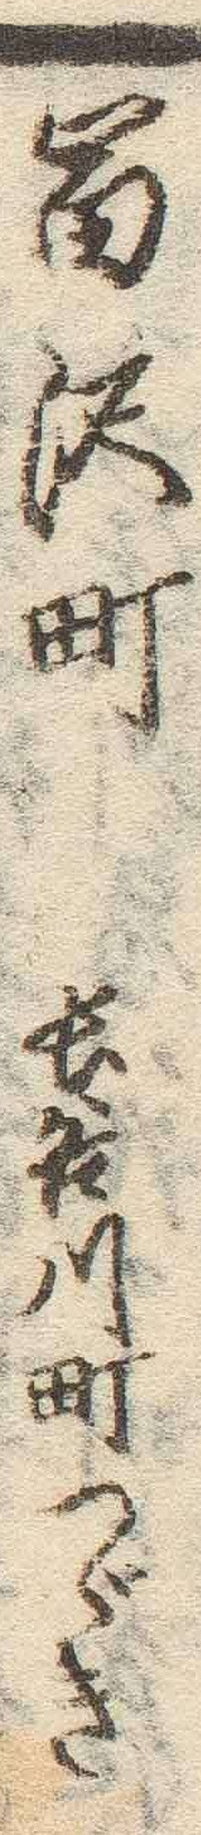富沢町長谷川町つゞき
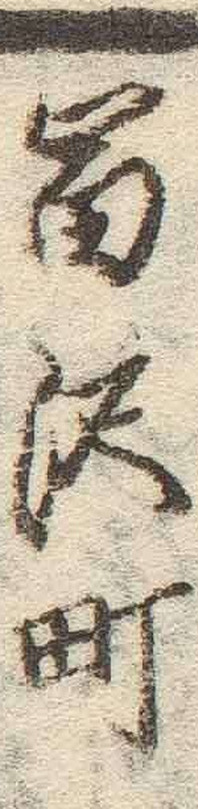富山町
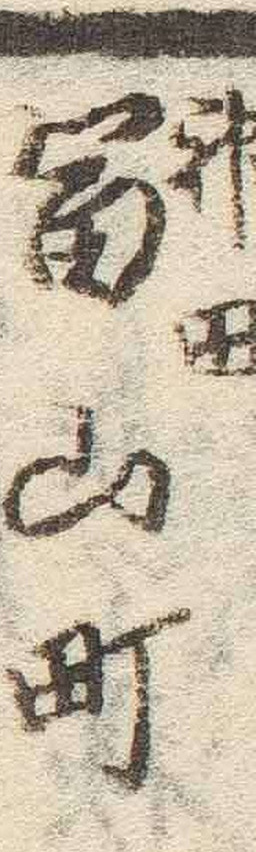富山町
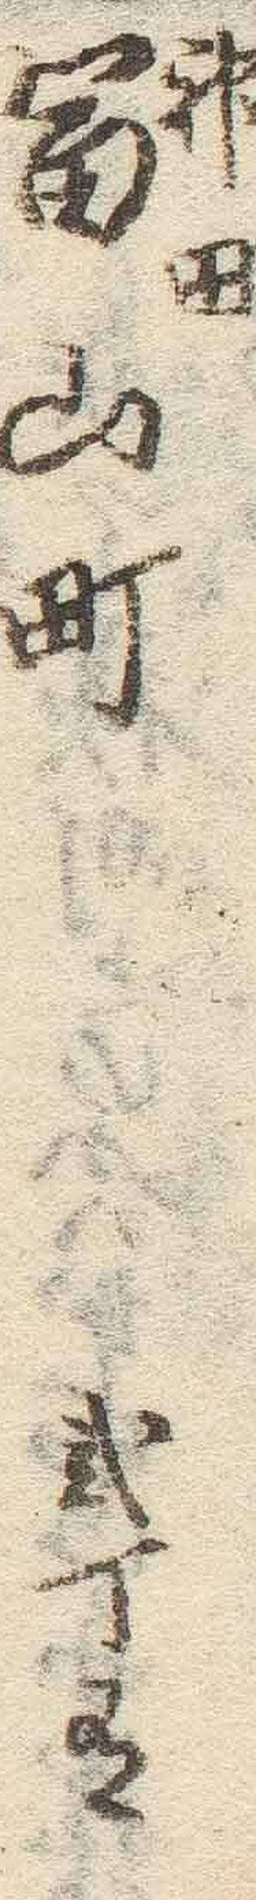富山町弐丁有
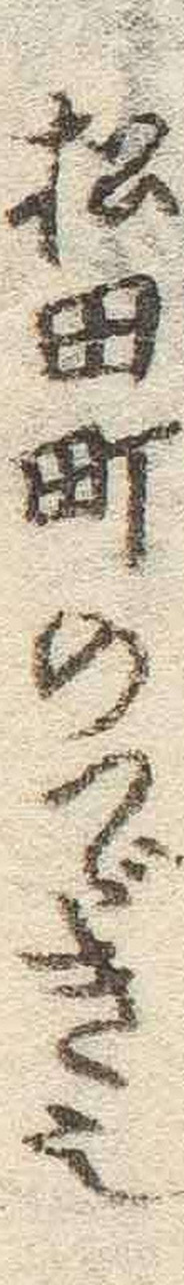松田町のつゞき也
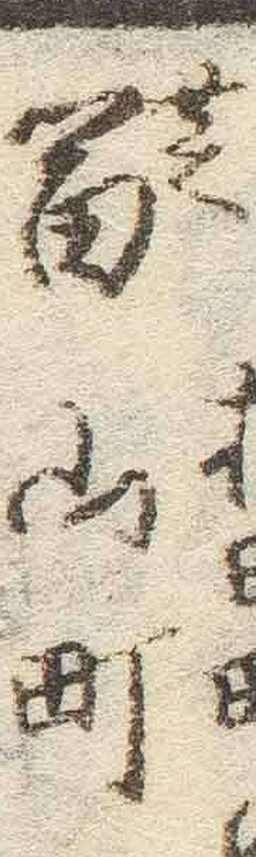富山町
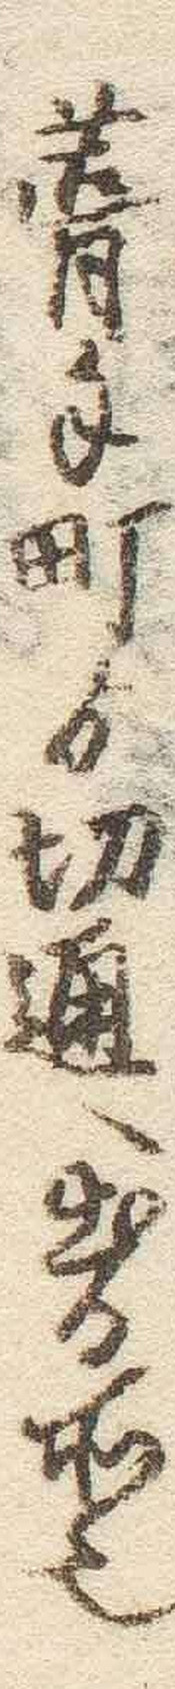葺手町ゟ切通へ出る所也
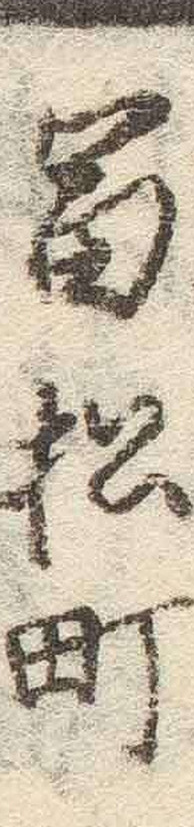富松町
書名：江戸町独案内
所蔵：東京学芸大学附属図書館 国文学研究資料館
